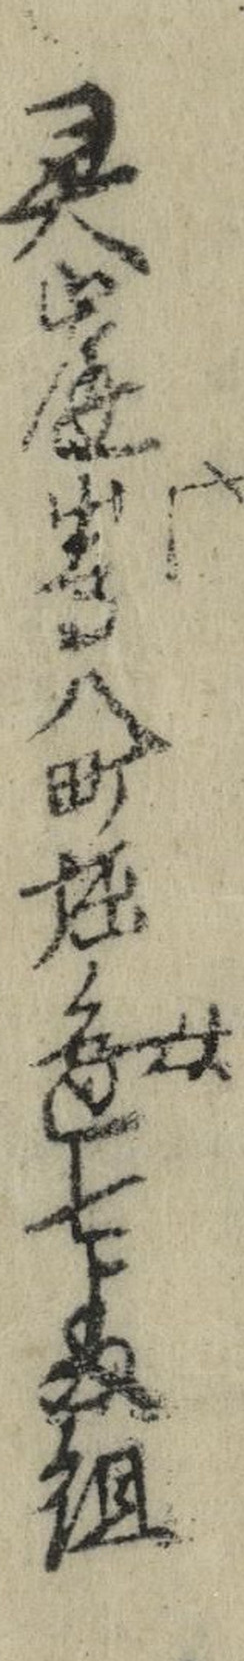霊岸島八町堀辺七番組
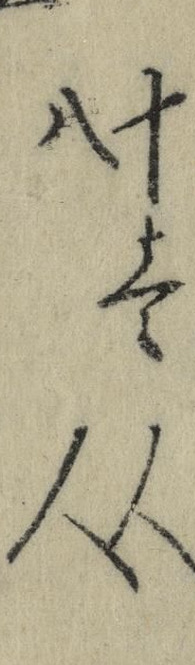女壱人
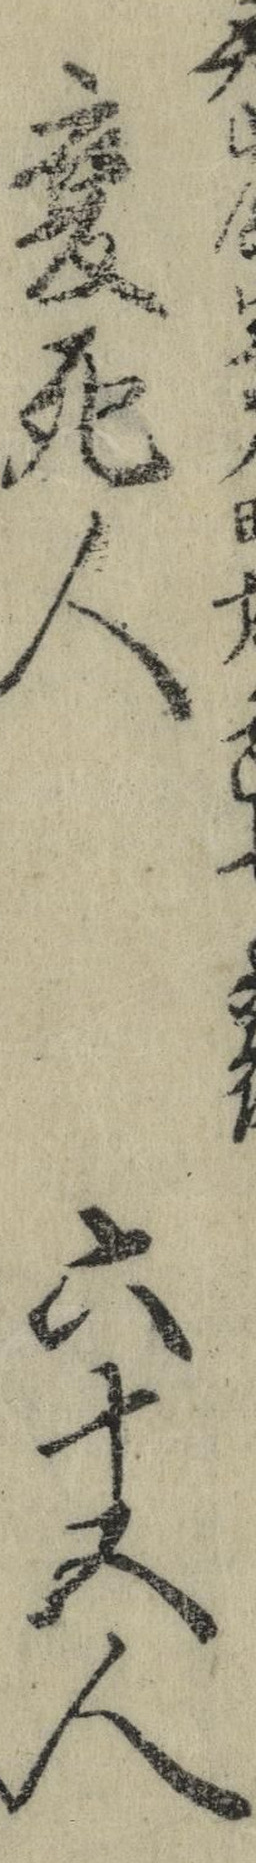変死人六十五人
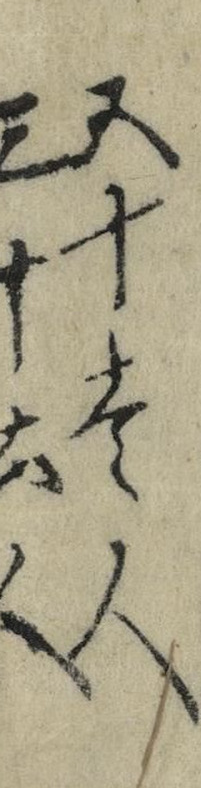女三十六人
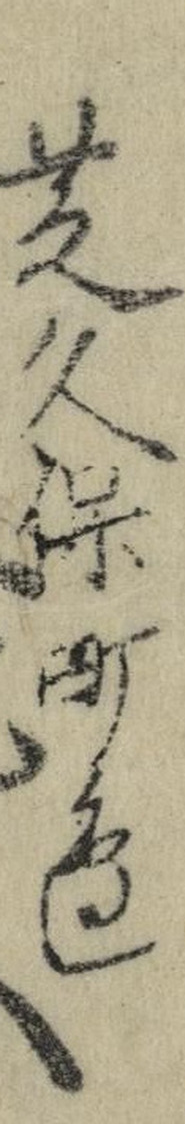芝久保町辺
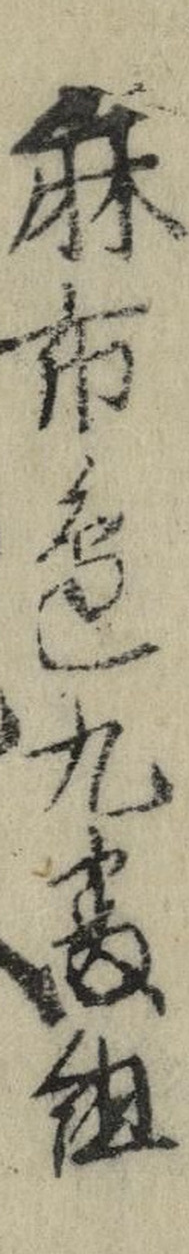麻布辺九番組
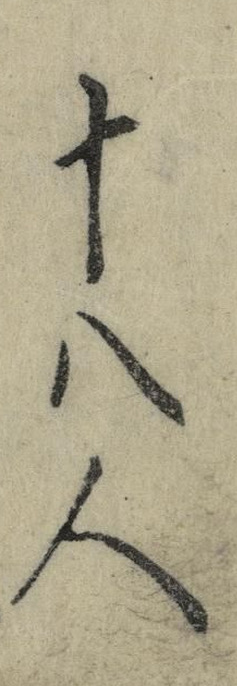女八人
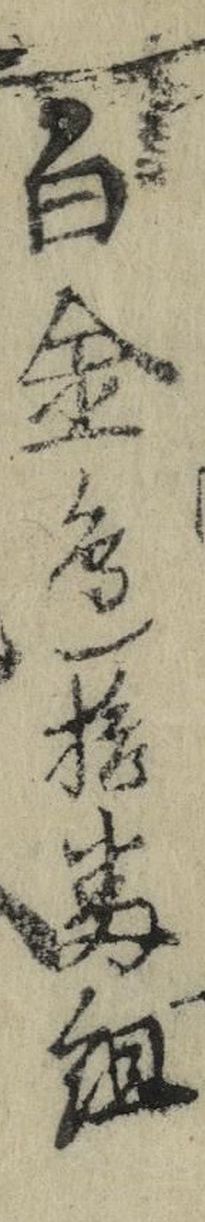白金辺拾番組
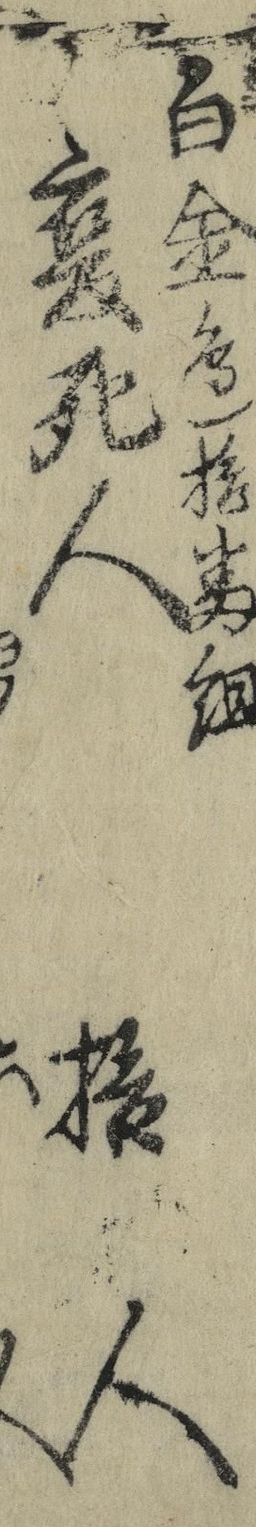変死人拾人

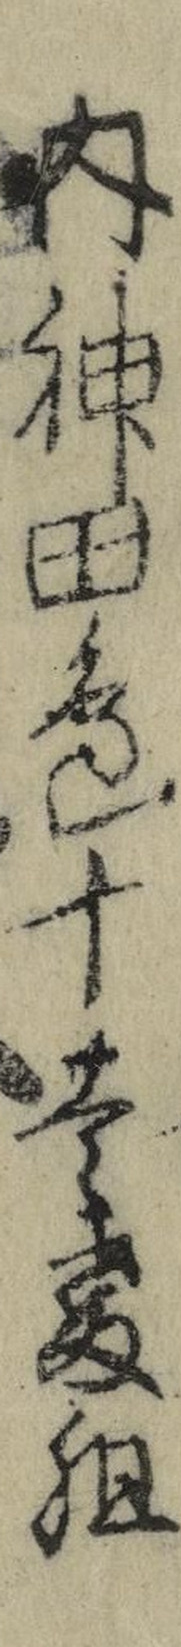内神田辺十壱番組
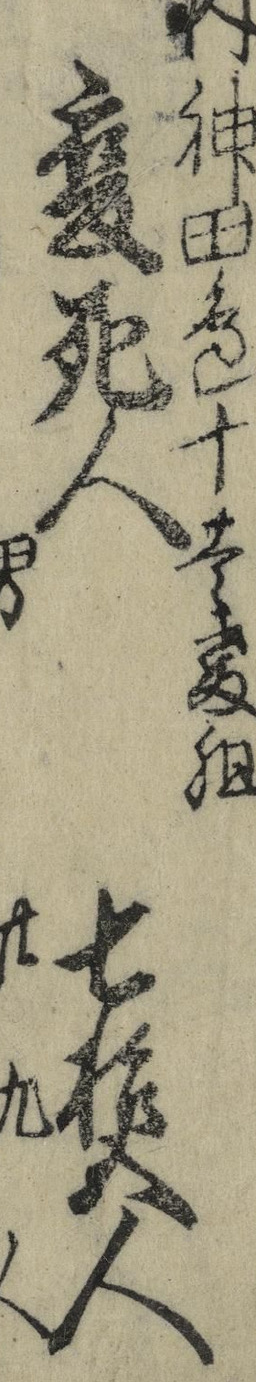変死人七拾五人
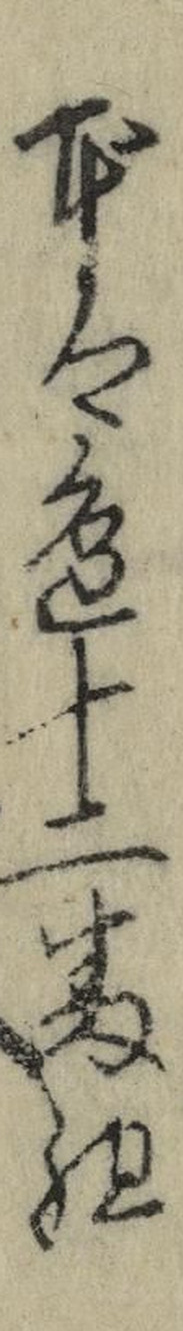本郷辺十二番組
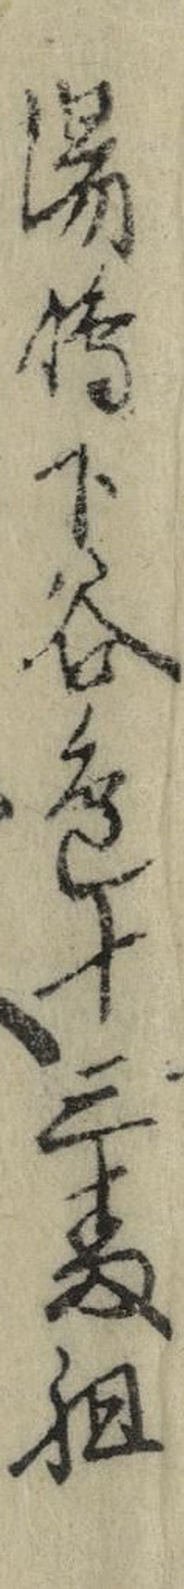湯島下谷辺十三番組
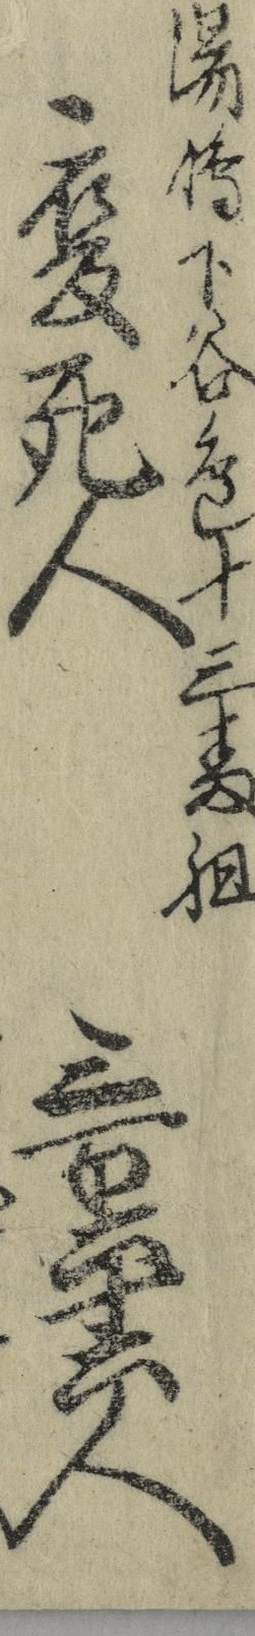変死人三百六十六人
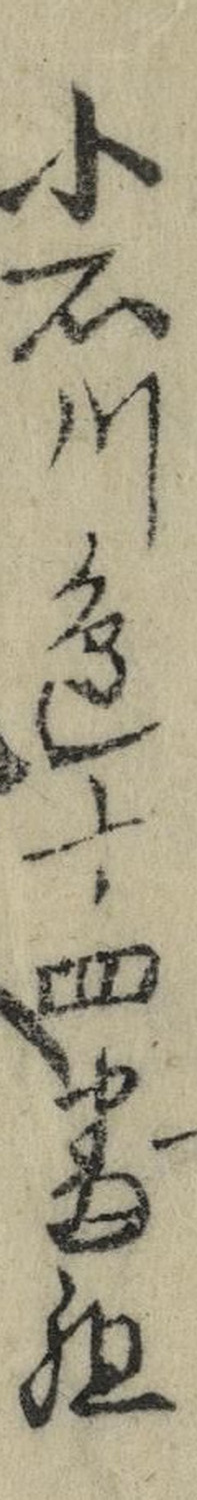小石川辺十四番組
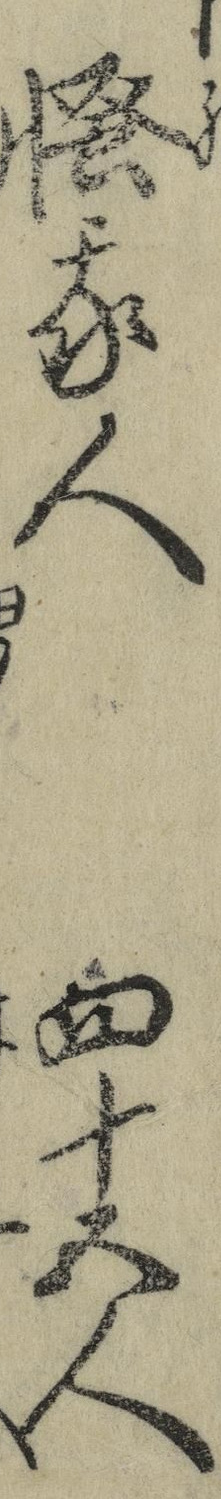怪我人四十五人
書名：地震出火　男女死人怪我人書上之冩
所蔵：東京大学地震研究所図書室 Earthquake Research Institute Library, The University of Tokyo, JAPAN
